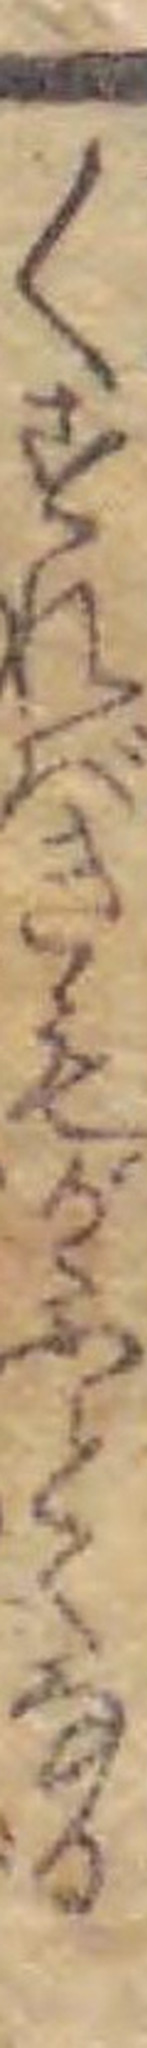〳〵すればきもがふとくなる
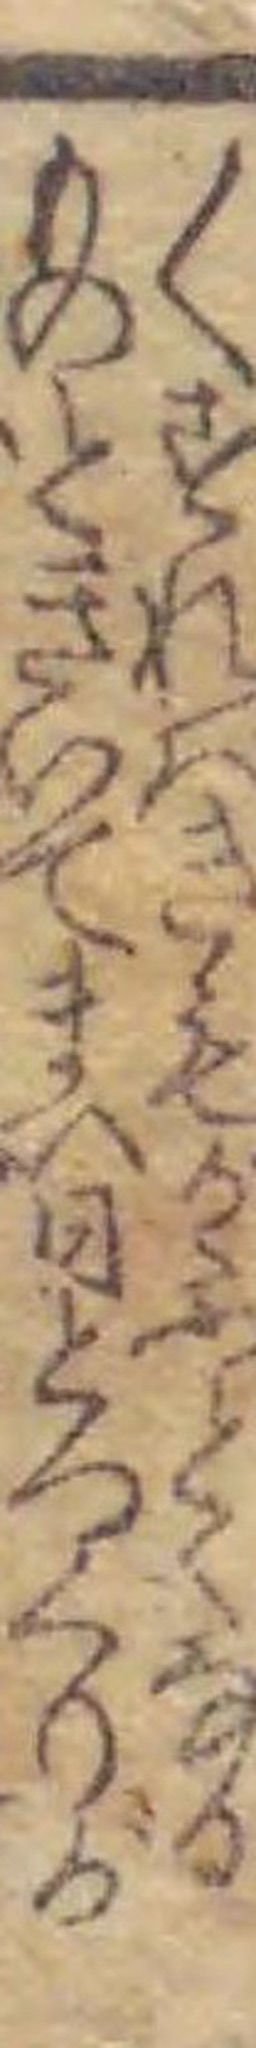ものときいてまい日とつくりが
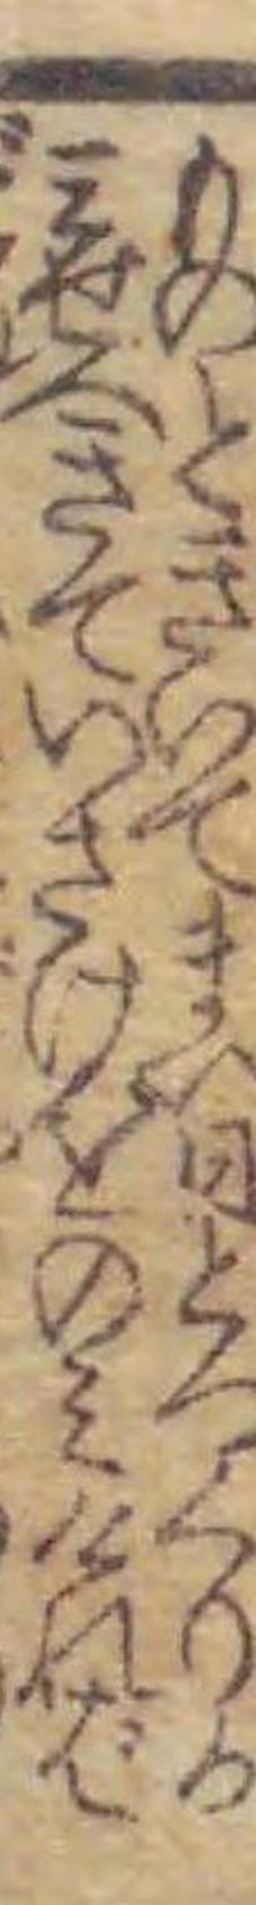みせへきていさけをのみければ
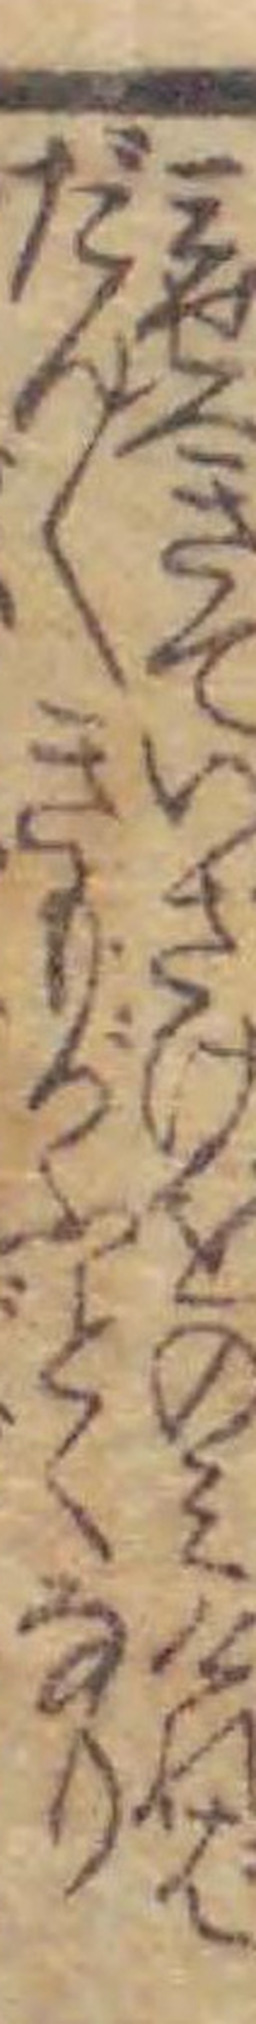だん〳〵きもづふとくなり
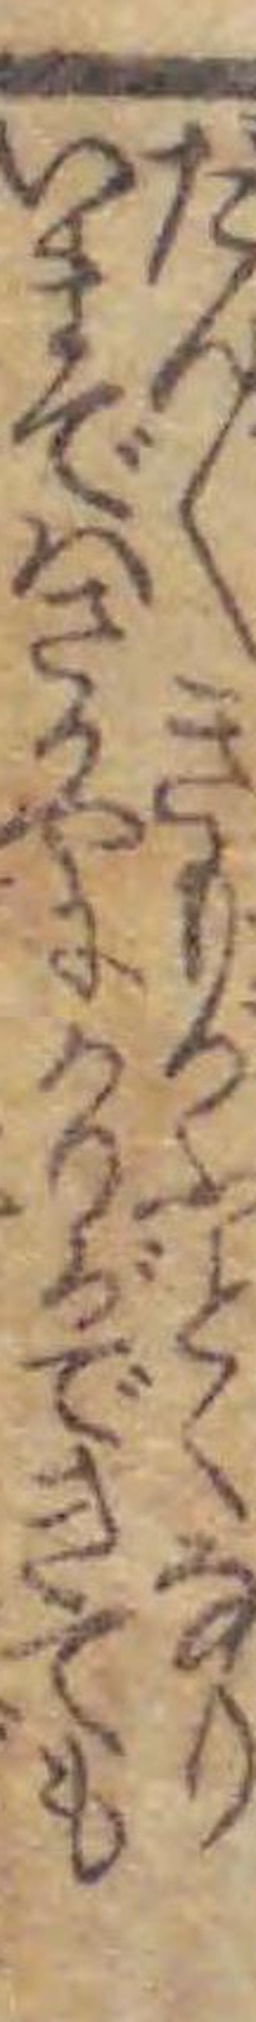いまではさかやにかりができても
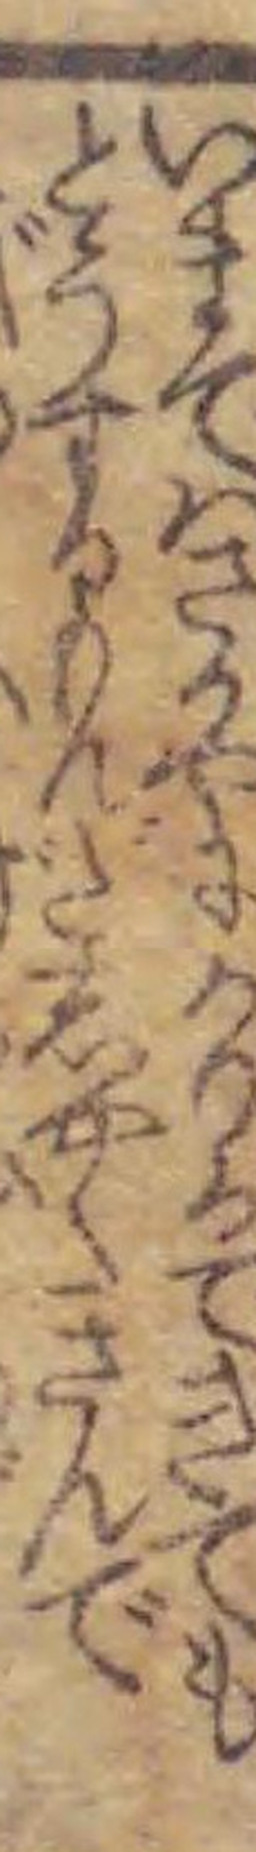とうするもんだしやくきんで
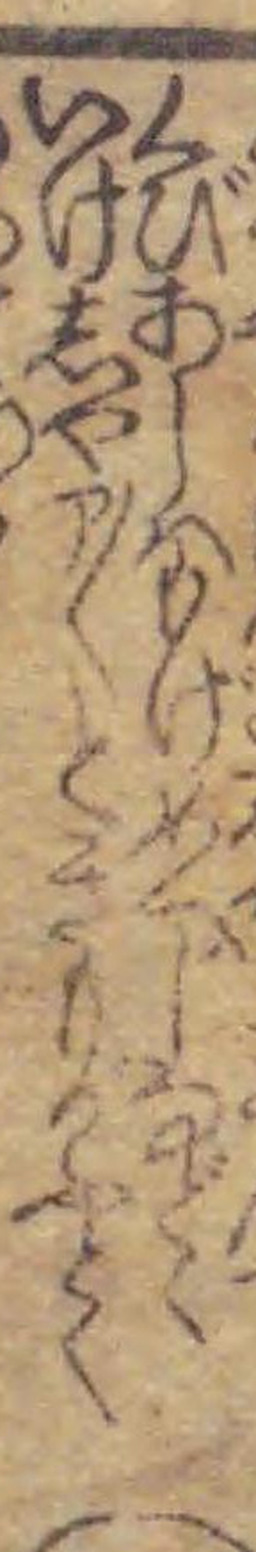いけしやア〳〵ときもかふとく
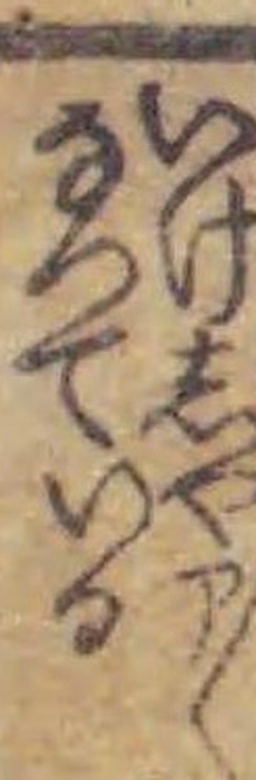なつている
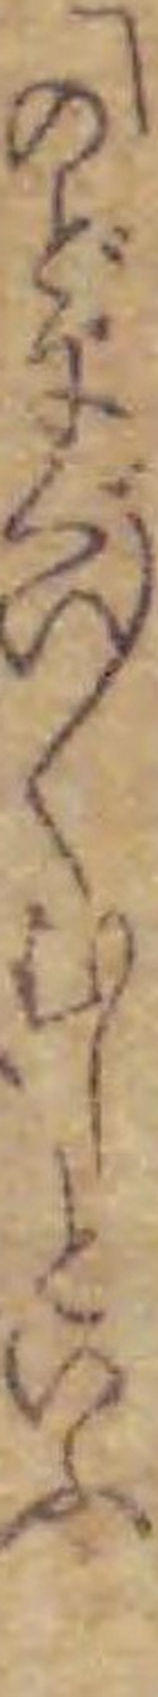〽のどにぐい〳〵むしといふ
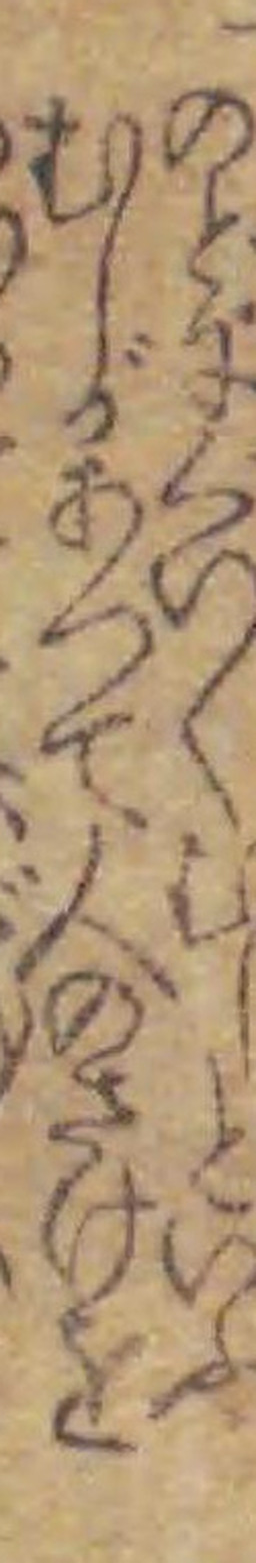むしがあつて人のさけを
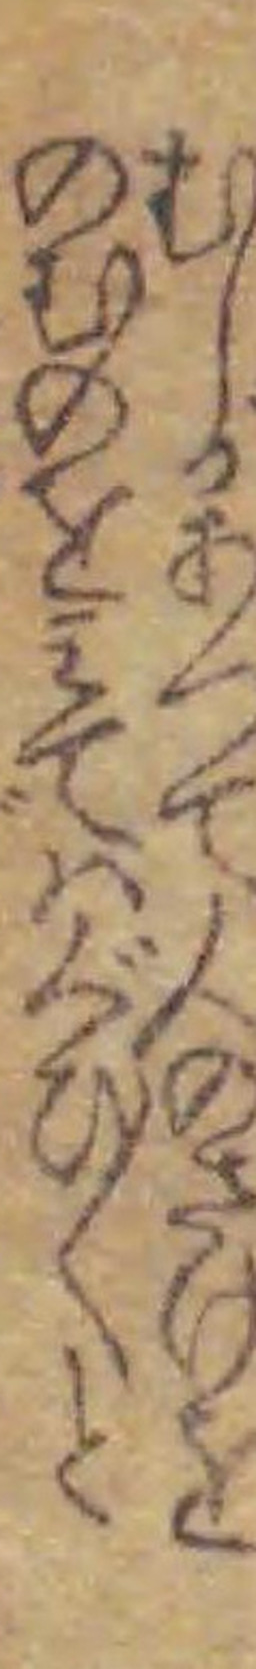のむのをみてはぐひ〳〵と
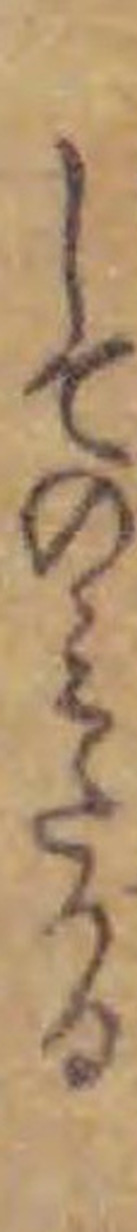してのみたがる
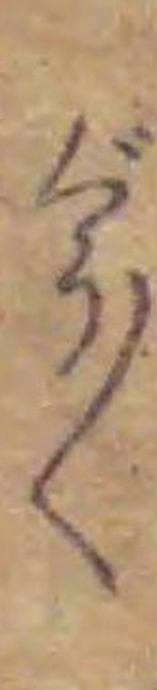ぐう〳〵

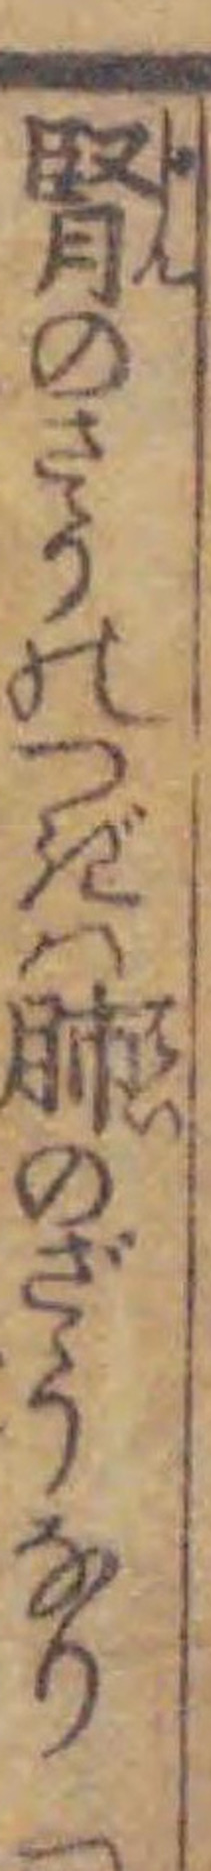腎のさうのつぎは肺のざうなり
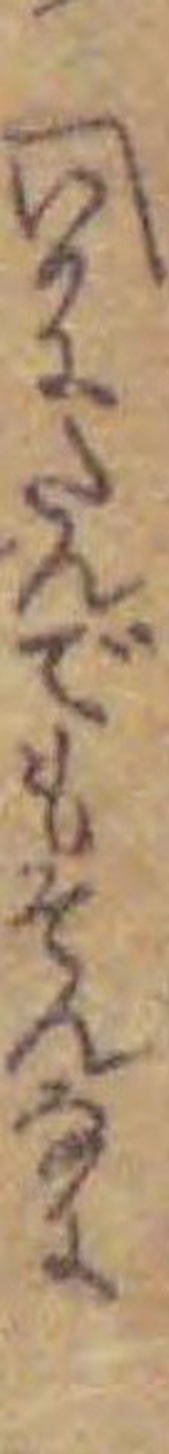〽いかにたんでもそんなに
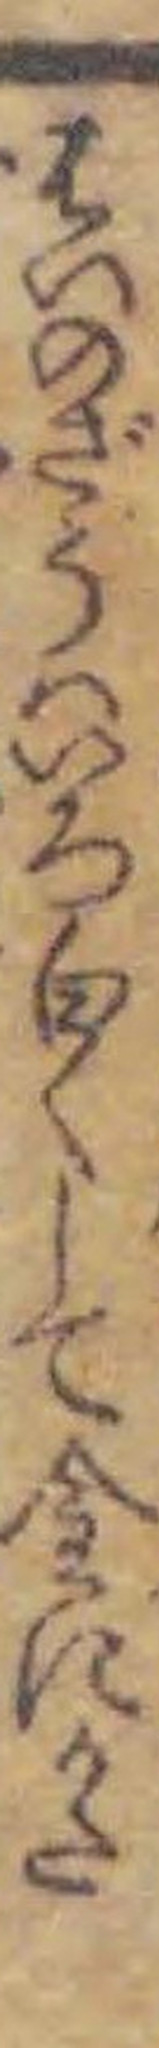はいのざうはいろ白くして金にかた
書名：十四傾城腹之内 : 3巻
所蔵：国立国会図書館 National Diet Library, JAPAN
